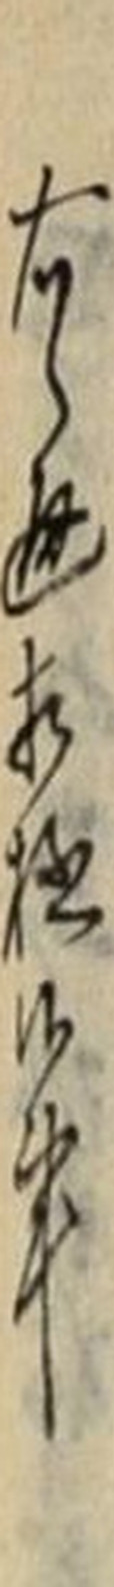右之通相認候事

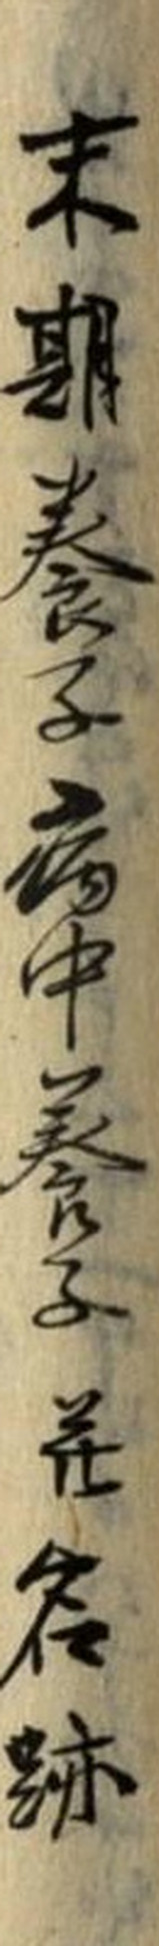末期養子病中養子并名跡
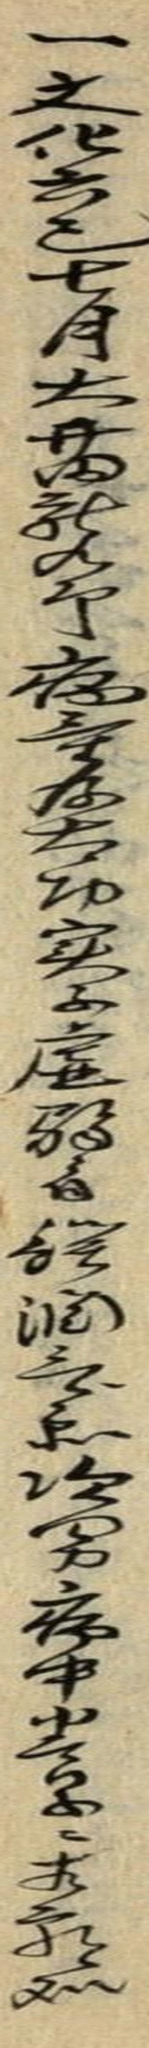一文化六巳七月大井田新九郎病気及太切実子虚弱ニ付鰐淵三郎兵衛次男病中養子ニ相願候処
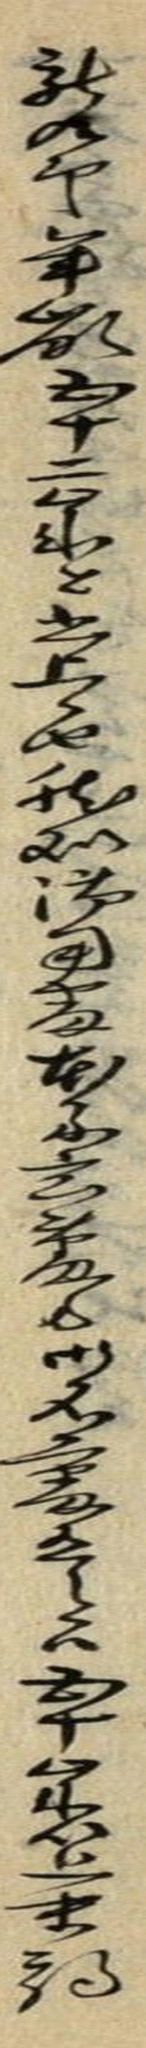新九郎年齢五十二歳と書上候由然処御用番本多玄蕃方御不審有之候ハ五十歳以上末期
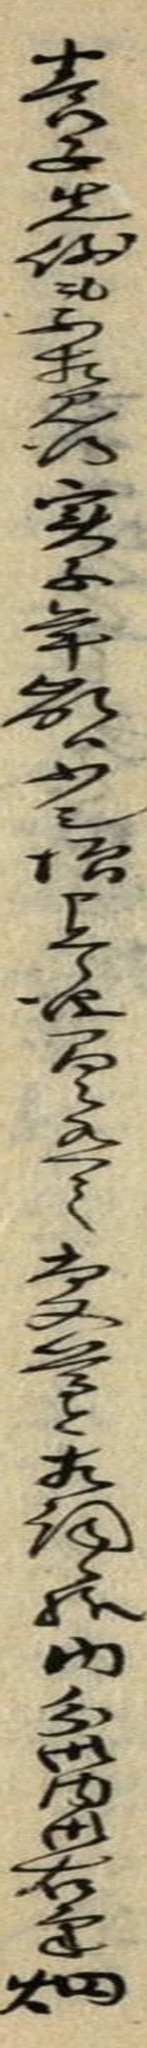養子先例も不相見得実子年齢ハ少シ増申上候儀間々有之尚又篤と相調候様内分御内御右筆畑
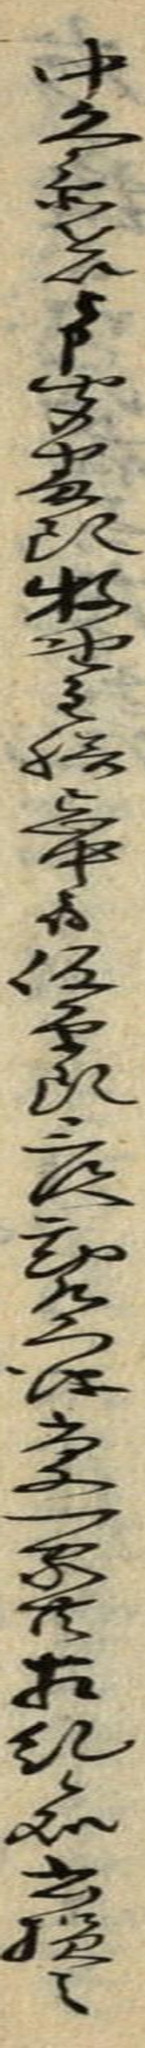中久兵衛を以被申聞番頭牧野主膳忌中ニ付仮筆頭三沢勘左衛門儀尚又一家共相糺候処書損之
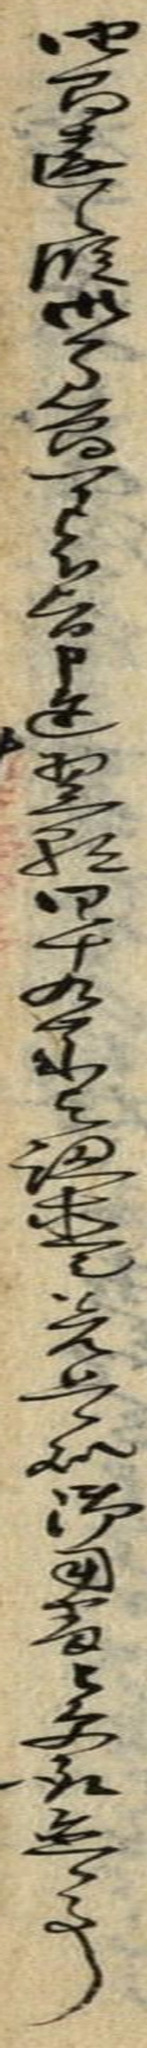由間違之段御了簡可被下旨申達翌朝四十九歳与認直シ差上候処御用番被受取置候事
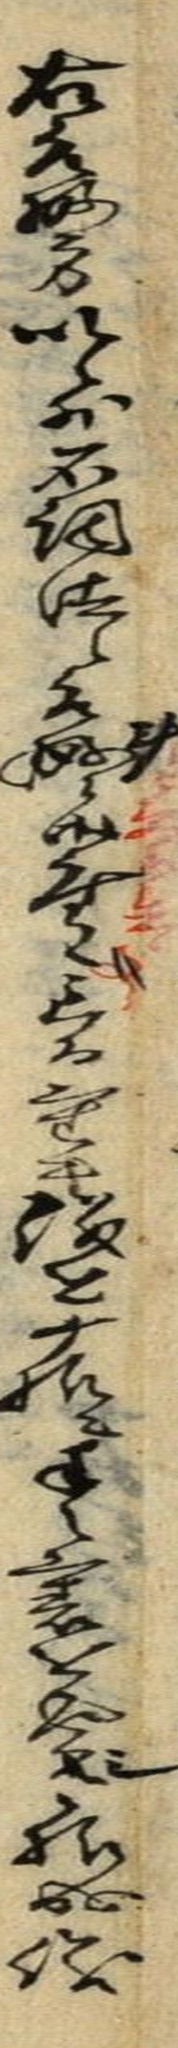右取扱方以之外不調法之取斗ニ御座候至而重キ儀をケ様ニ手之裏を返シ候様成儀
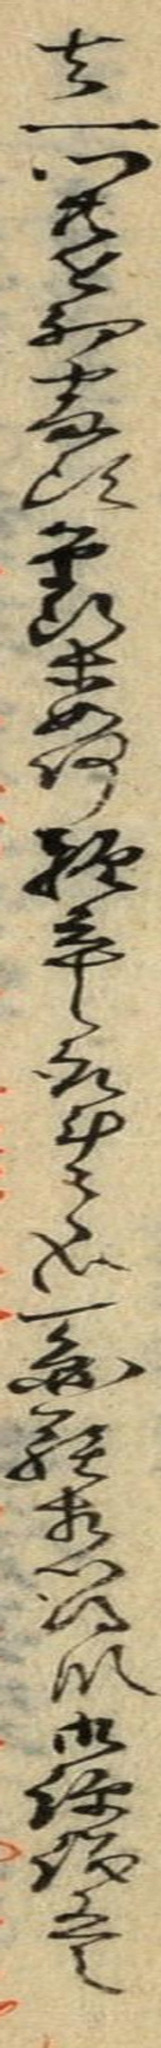者一門共を初番頭筆頭等如何軽卒之取斗ニ候哉一円難相心得段御評議有之
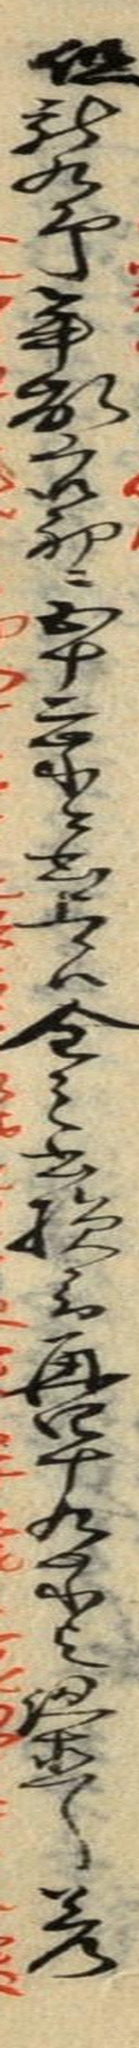但新九郎年齢最初ニ五十二歳と書上候ハ全之書損ニ而再四十九歳与認直し差
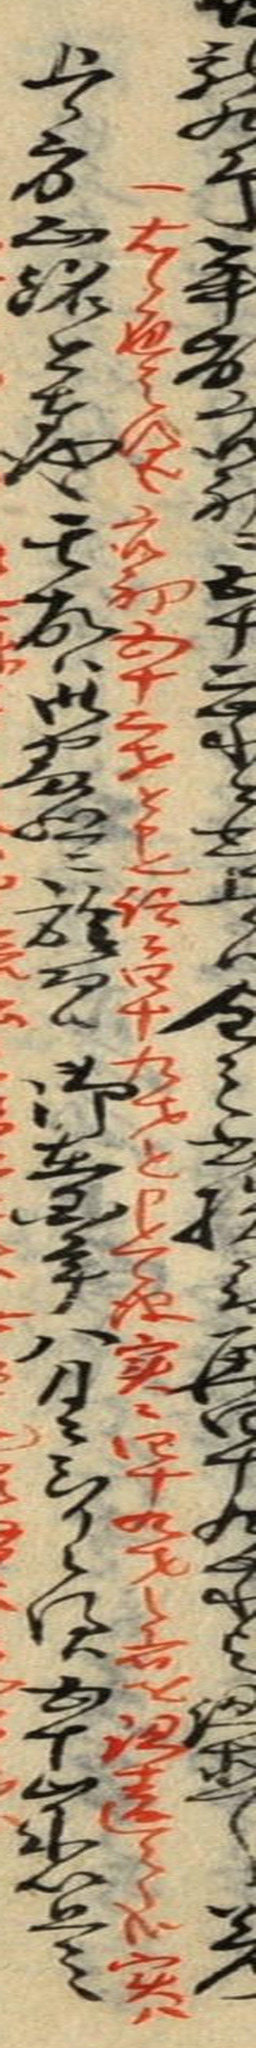上候方正路と奉存候其故ハ御番組ニ於而ハ御在国年八月二至り候得ハ五十歳以上之
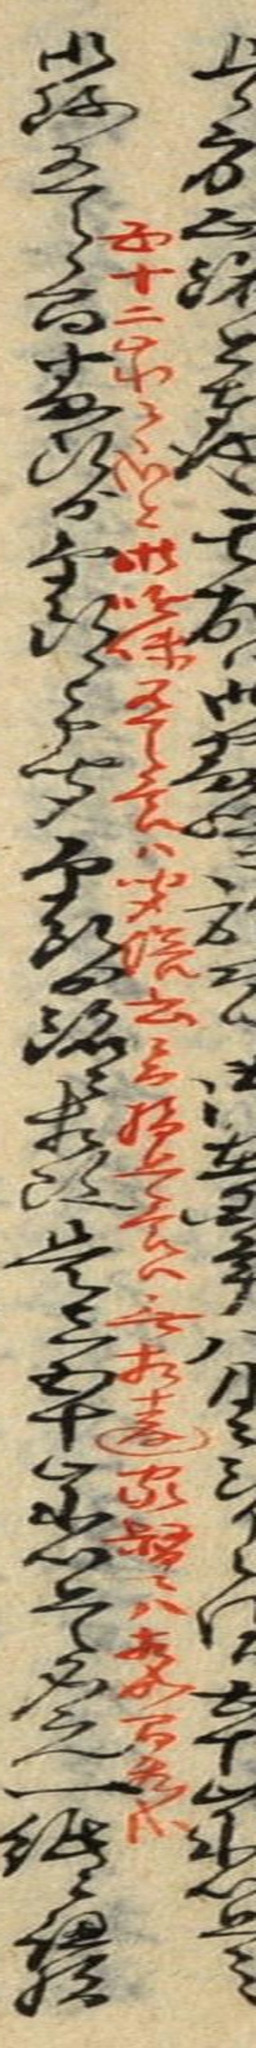御改有之候間番頭ゟ筆頭ヘ被申聞筆頭ゟ銘々相改是迄五十歳以上之名元一紙ニ認指
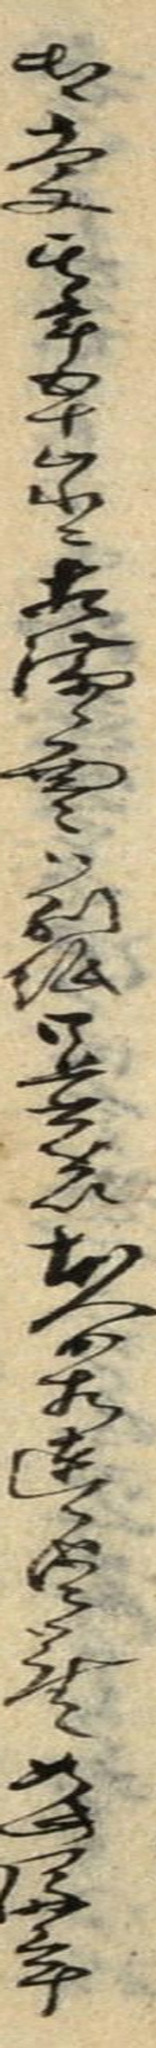出候尚又其年五十歳ニ相満候面々ハ別紙口上書を以本人ゟ相達候儀ニ御座候如此隔年
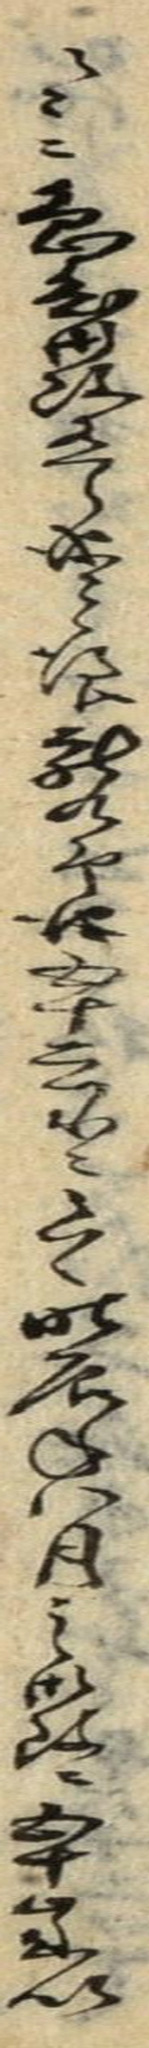々々ニ急度御改有之儀ニ候得ハ新九郎儀五十二歳ニ候ハヽ昨辰年八月之御改ニ五十歳以
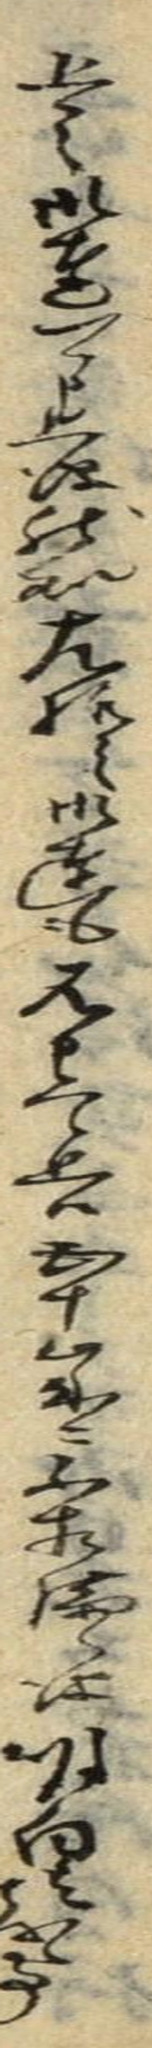上之御達可申上儀然処左様之御達も不申上候上ハ五十歳ニ不相満候儀明白与奉存候事
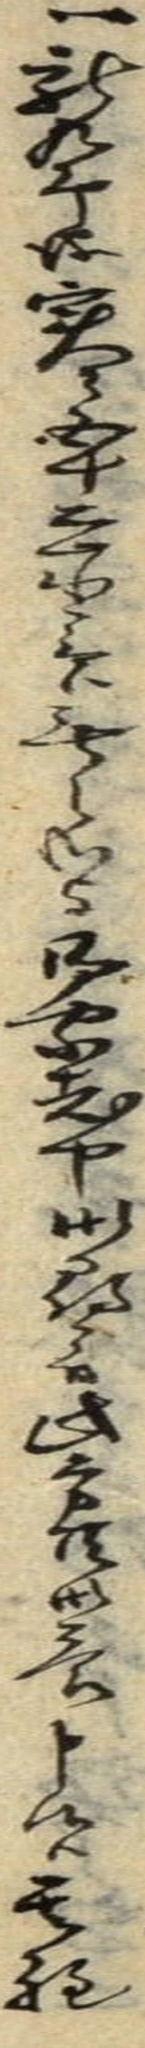一新九郎儀実者五十歳ニ而ハ無之哉与御家老中御尋候ニ付此方共御答申候ハ其程
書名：養子縁組之部
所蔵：福井県文書館 Fukui Prefectural Archives
